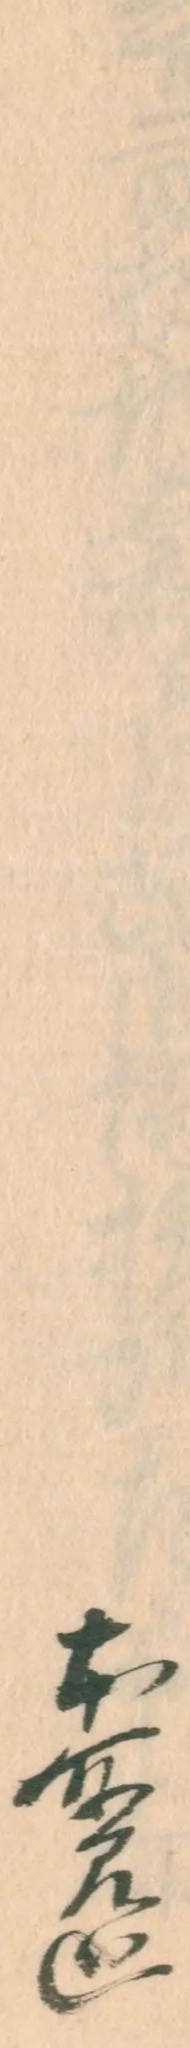本所見廻
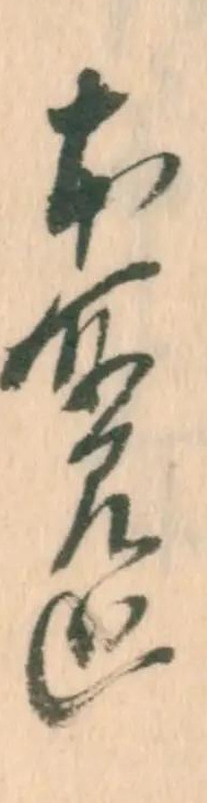本所見廻
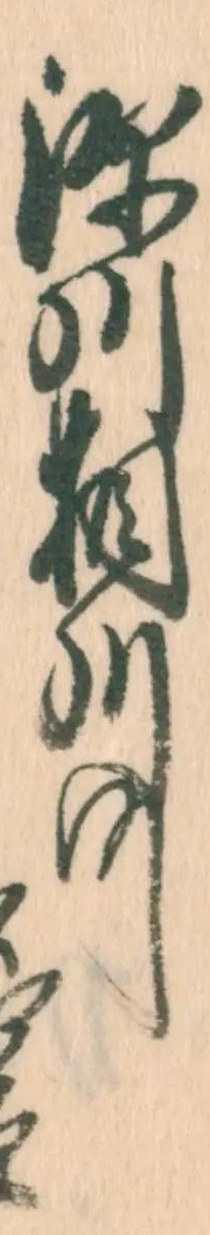深川相川町
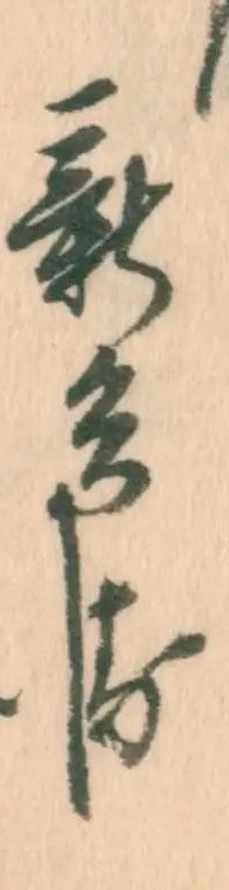新兵衛
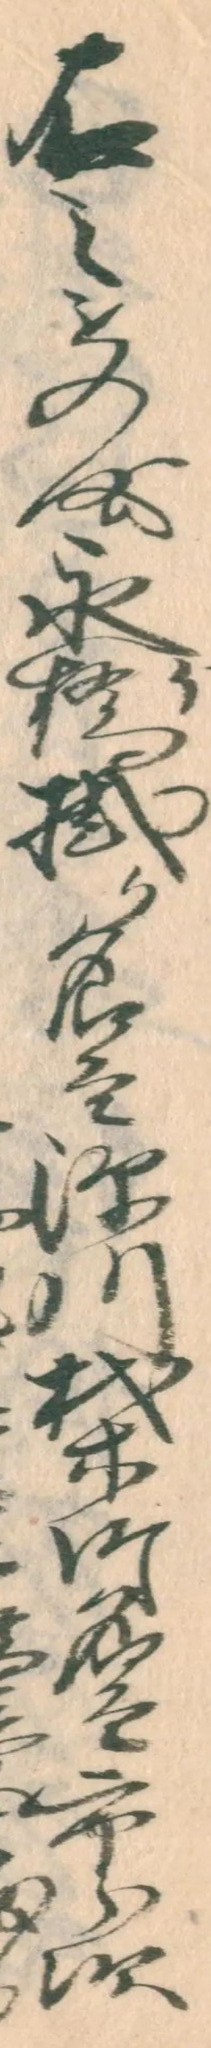右之もの儀永代橋掛り名主深川材木町名主市郎次
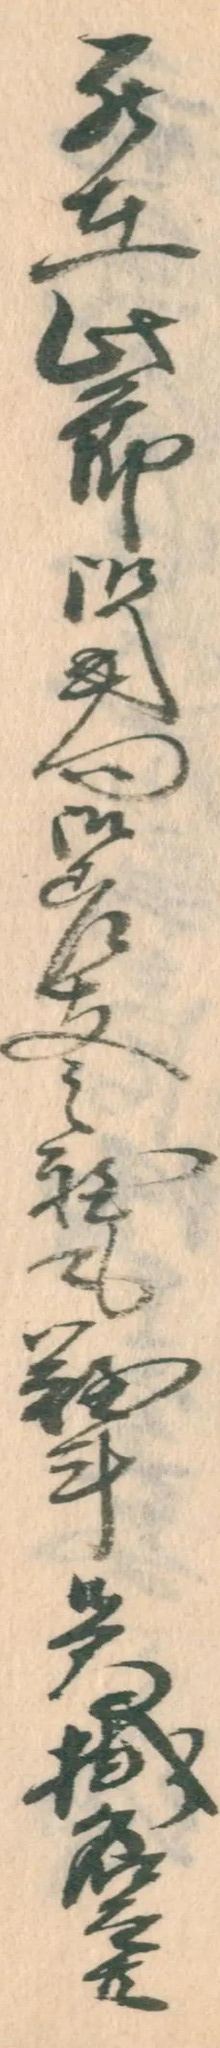罷在此節御用向御差支之程も難計候間掛り名主共

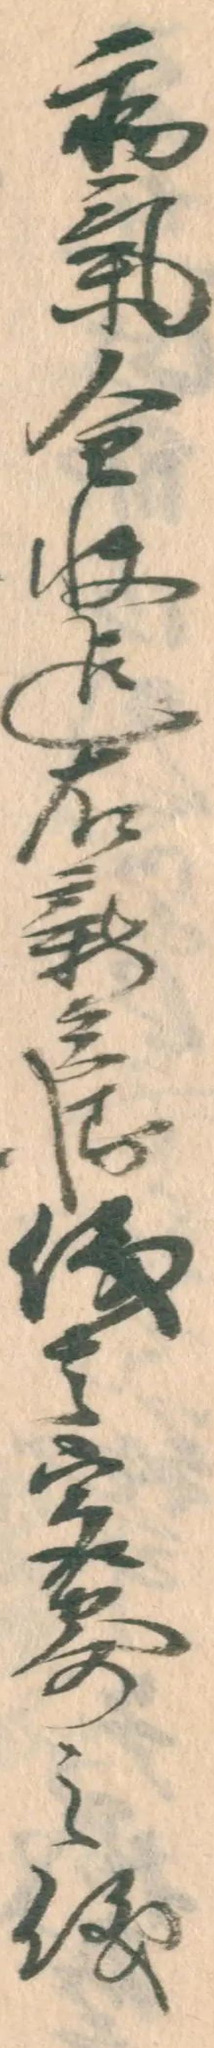病気全快迄右新兵衛儀は最寄之儀
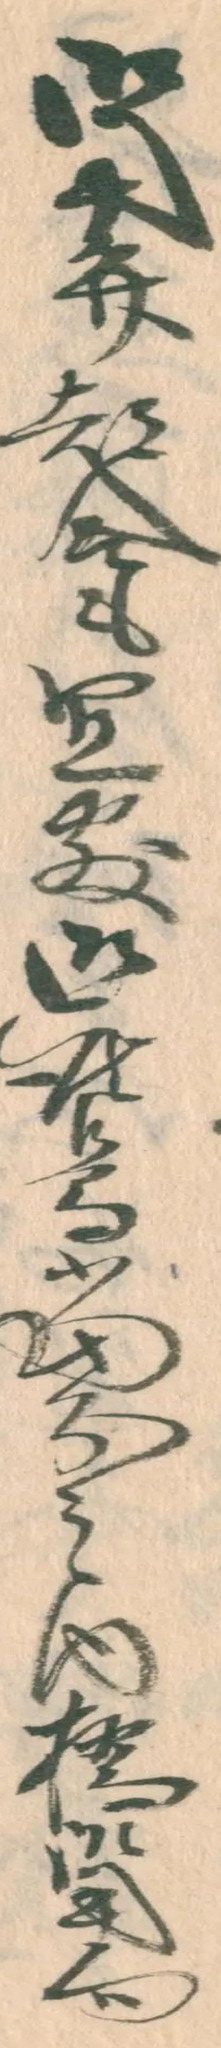御用弁都合も宜敷御座候間当分之内橋御用向
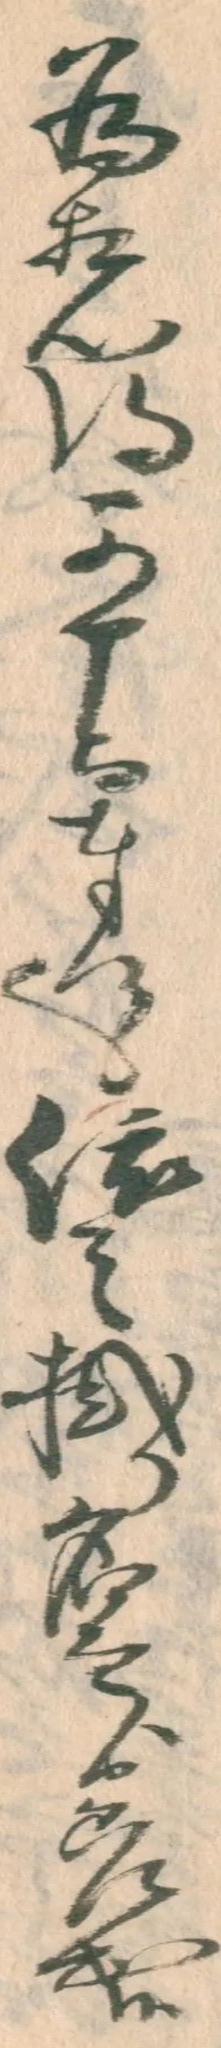為相心得可申と奉存候依之掛り名主ゟ差出候
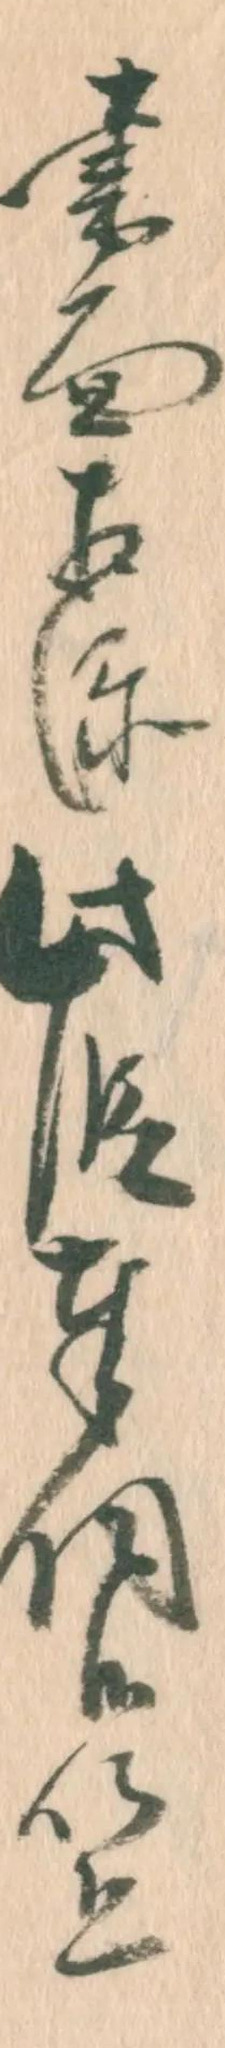書面相添此段奉伺候以上
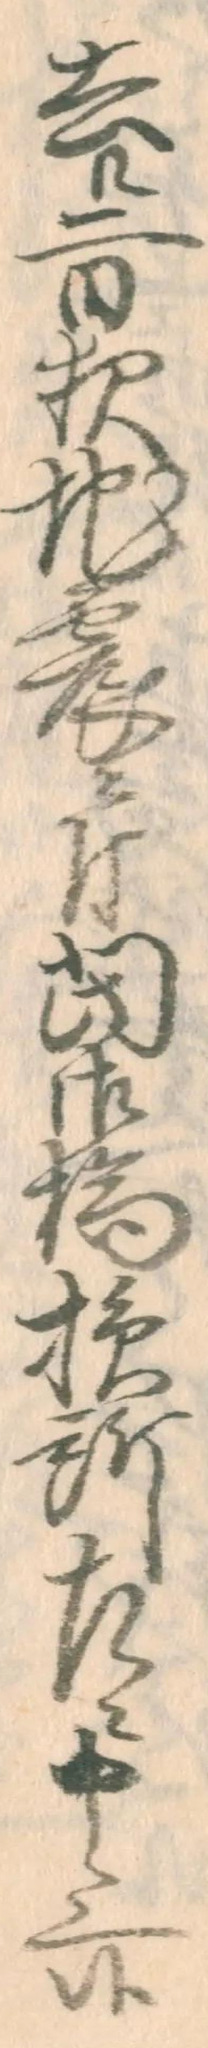去ル二日夜地震ニ付当御橋損所左ニ申上候
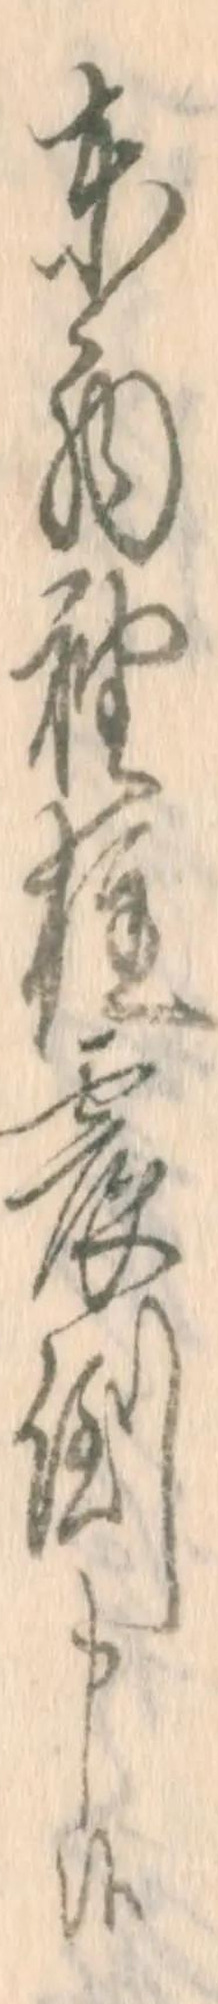一東西袖柱震倒申候
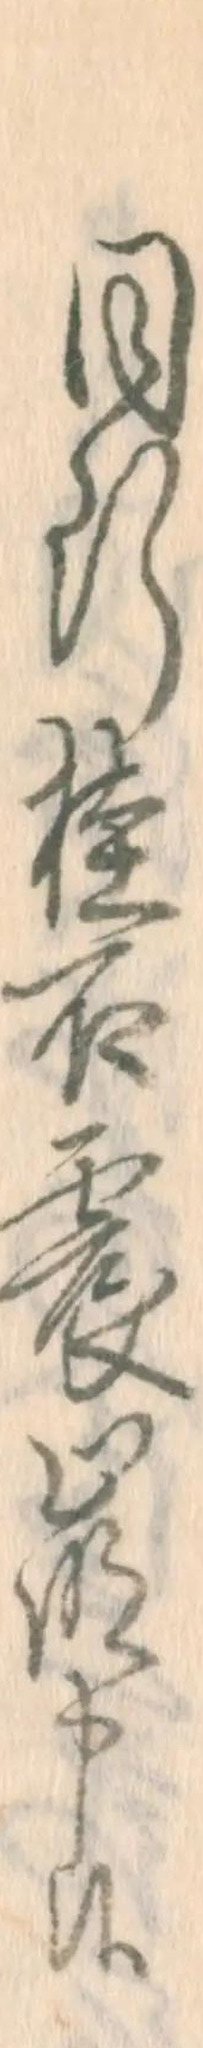一同断柱石震崩申候
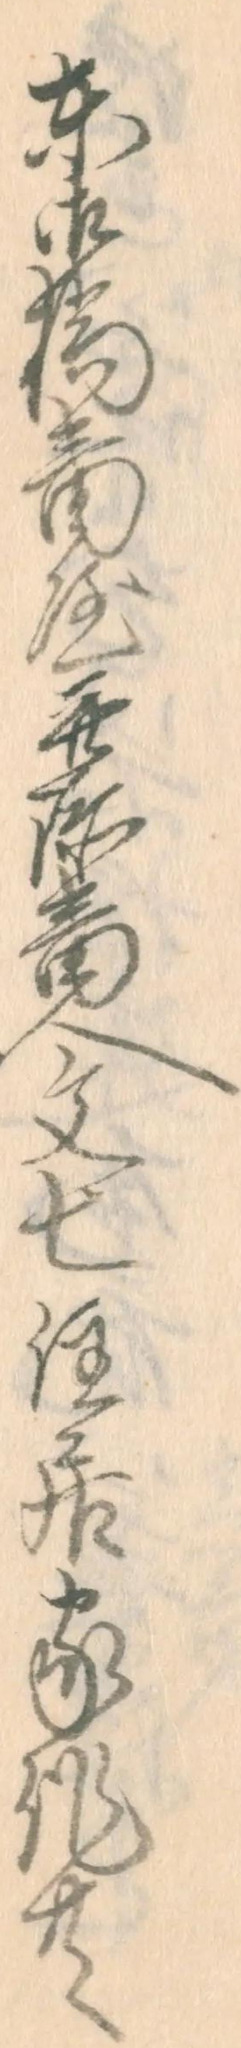一東御橋番屋并添番人文七住居家作共
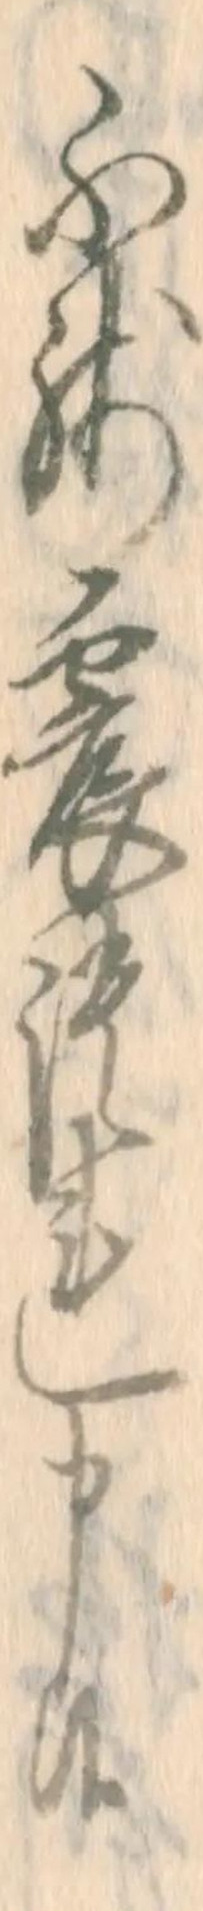不残震潰れ申候

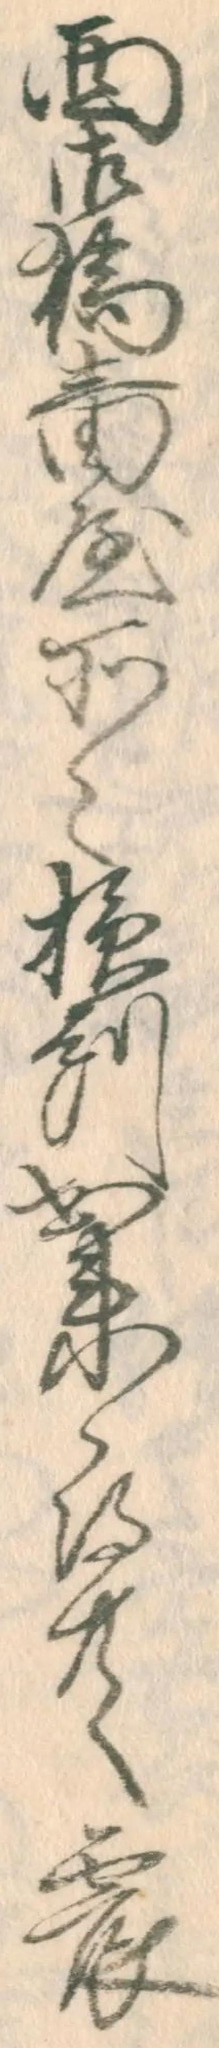一西御橋番屋所々損所出来候得共震
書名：地震災書留 2巻. [1] 内表紙に「地震災書留　安政二卯年　但本所深川御用屋敷地代免除調」とあり
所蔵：国立国会図書館 National Diet Library, JAPAN
